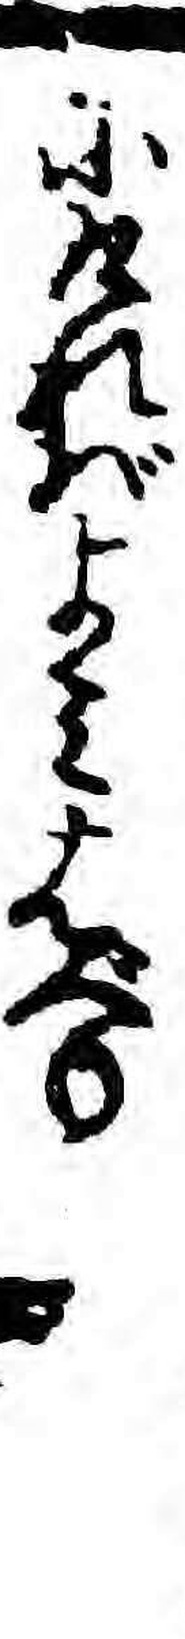にければよみはべり
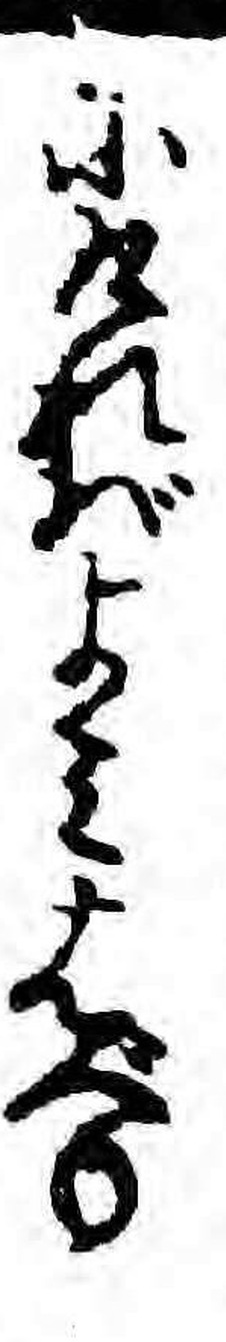にければよみはべり
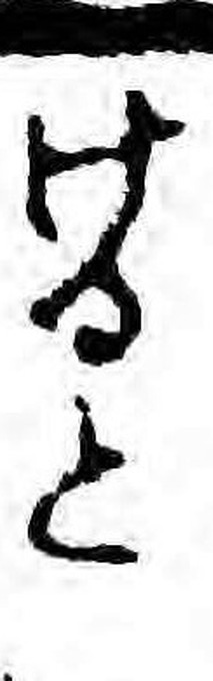けると
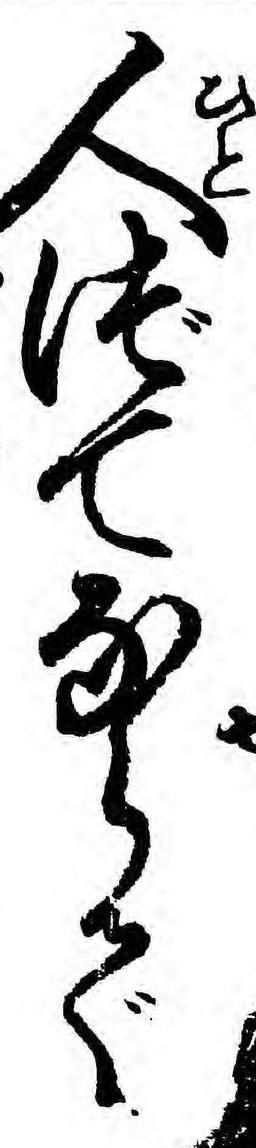人づてならで
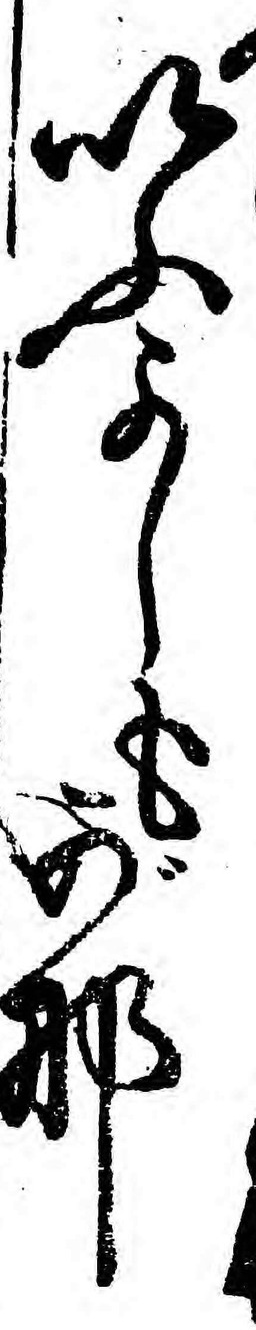いふよしもがな
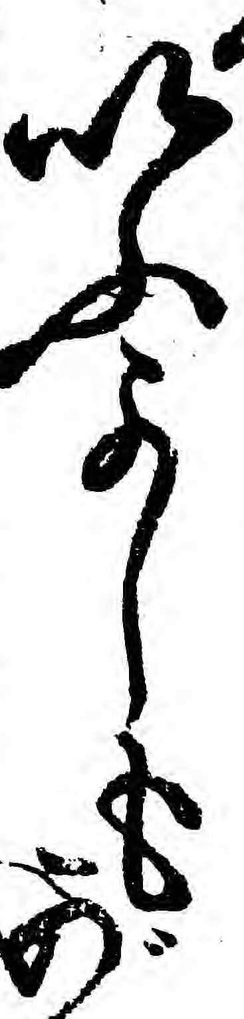いふよしもがな

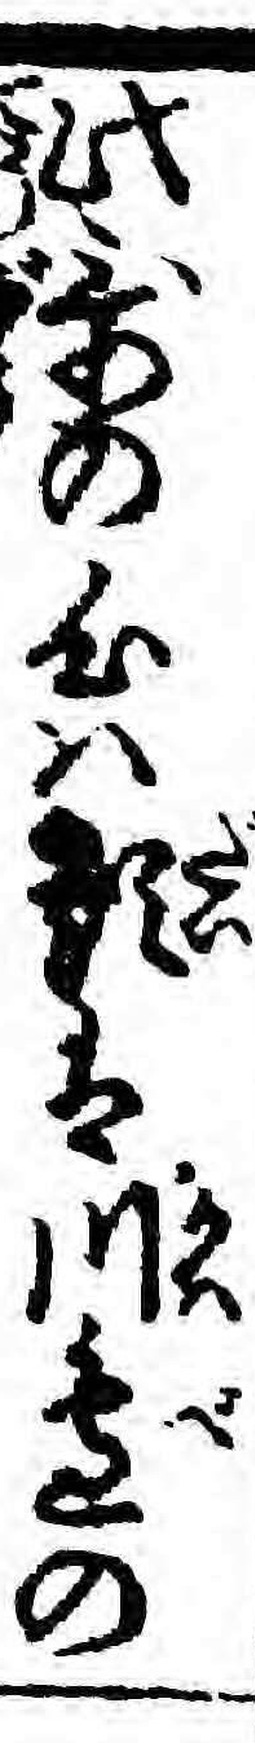此哥の心は題は川辺の
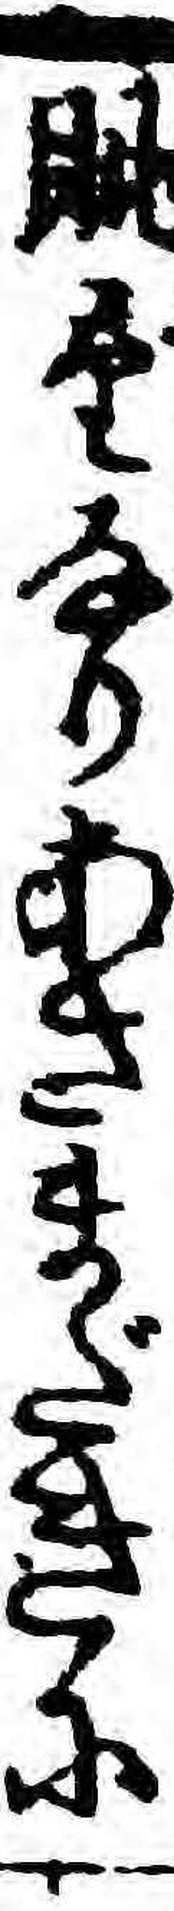眺望なりあさまだきに
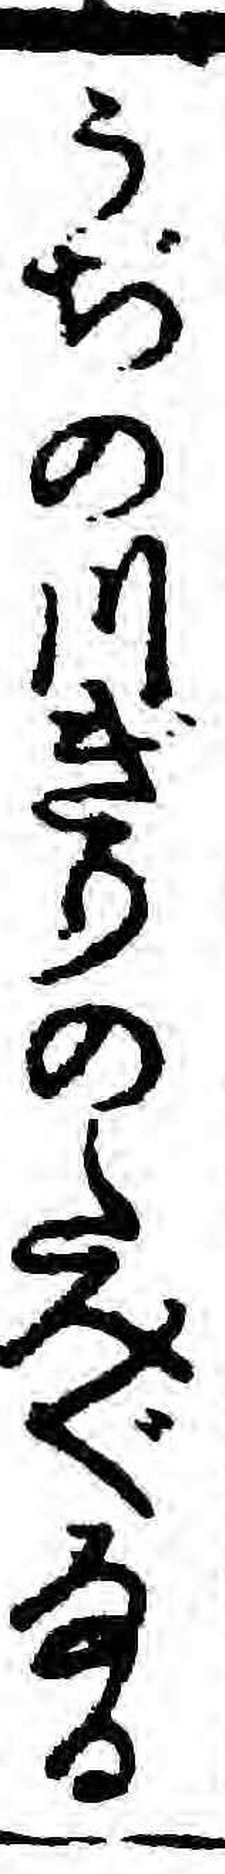うぢの川ぎりのたへ〴〵なる
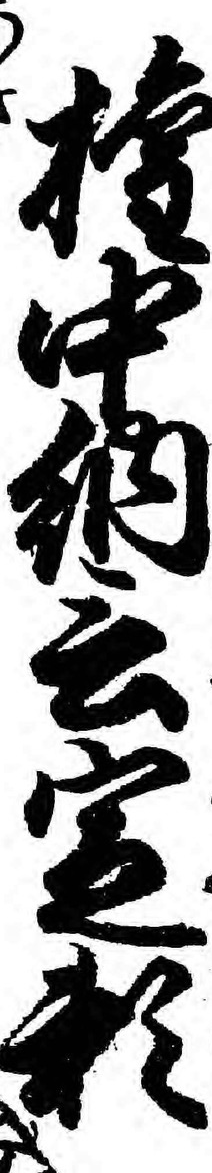権中納言定頼
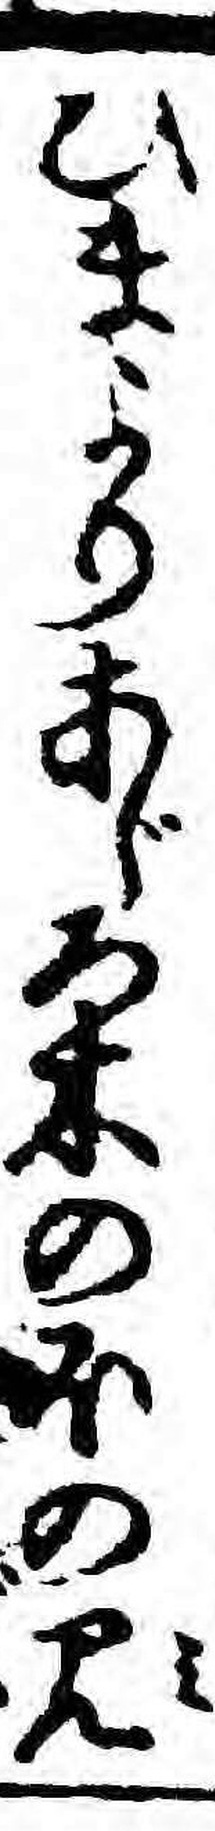ひまよりあじろ木のほの見
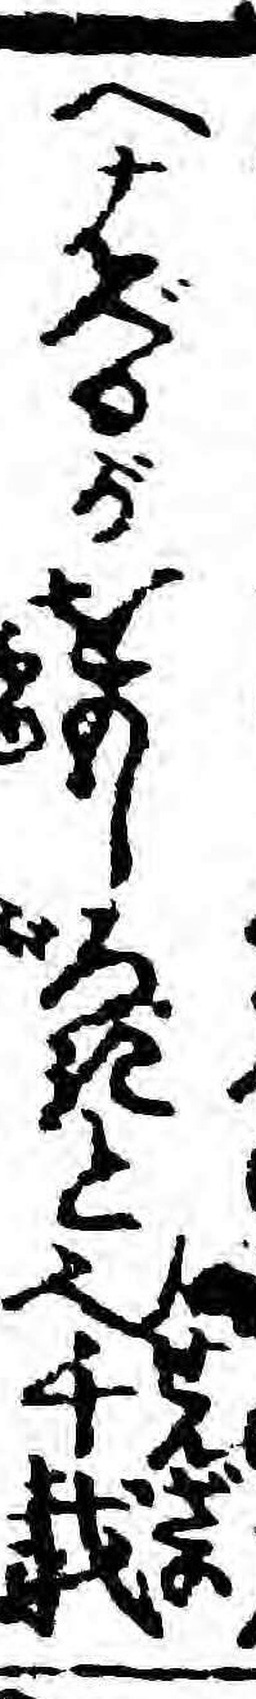へはべるがおもしろきと也千載
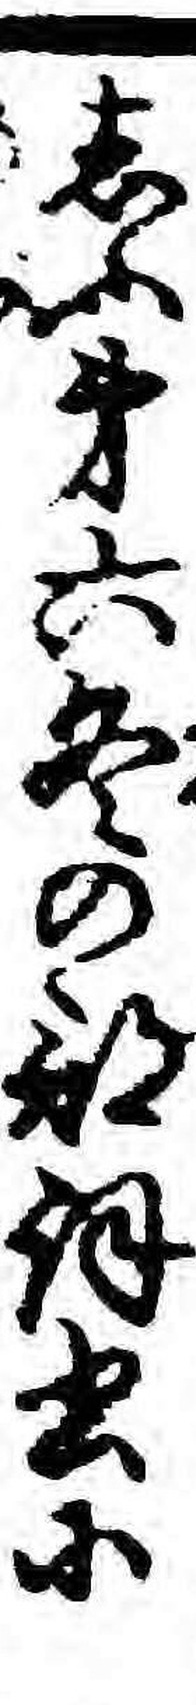しふ第六冬の部詞書に
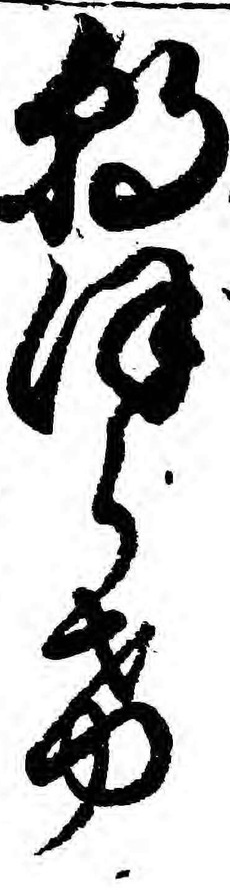朝ぼらけ
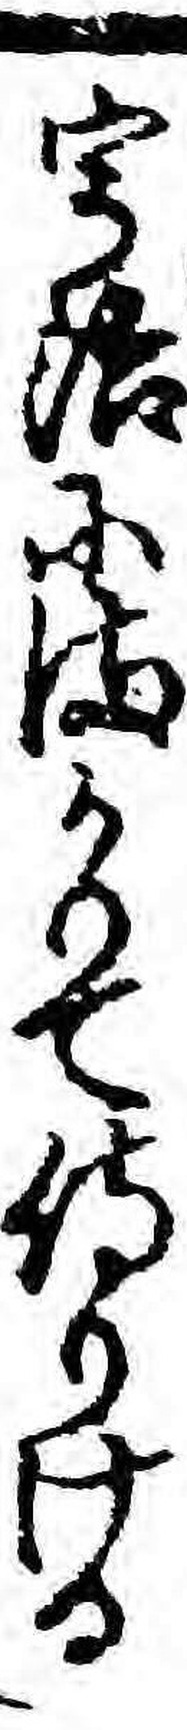宇治にまかりて侍りける
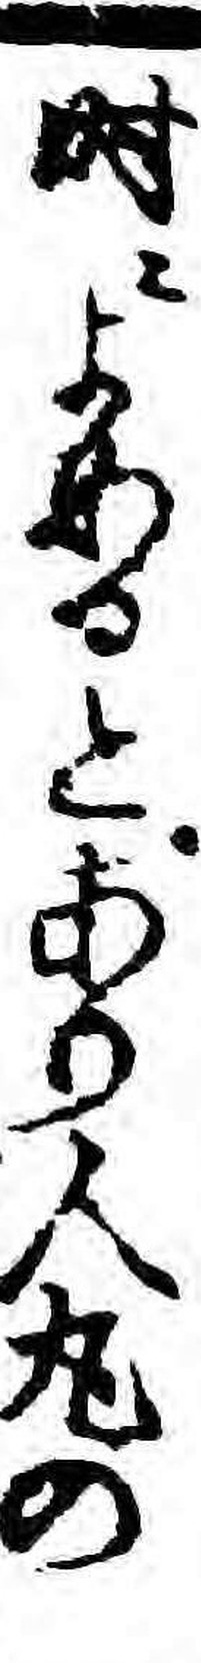時によめるとあり人丸の
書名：頭書和歌注譯／壽賀多百人一首小倉錦
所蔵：国文学研究資料館
